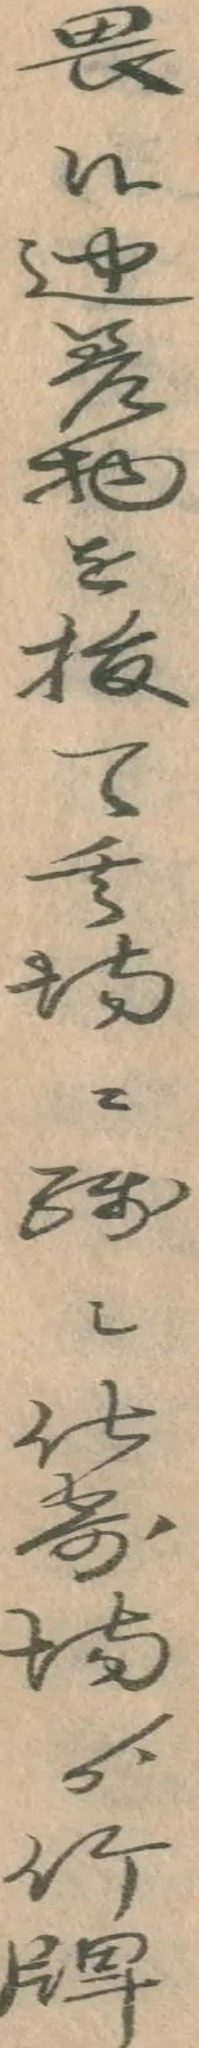畏候迚差物を抜て其場に残し仕寄場ゟ竹牌
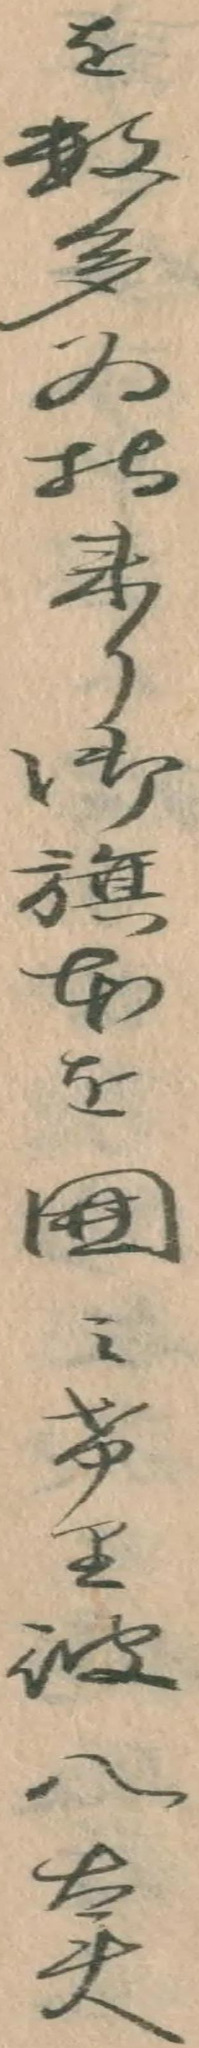を数多ゐ持参り御旗本を囲み希里彼八太夫
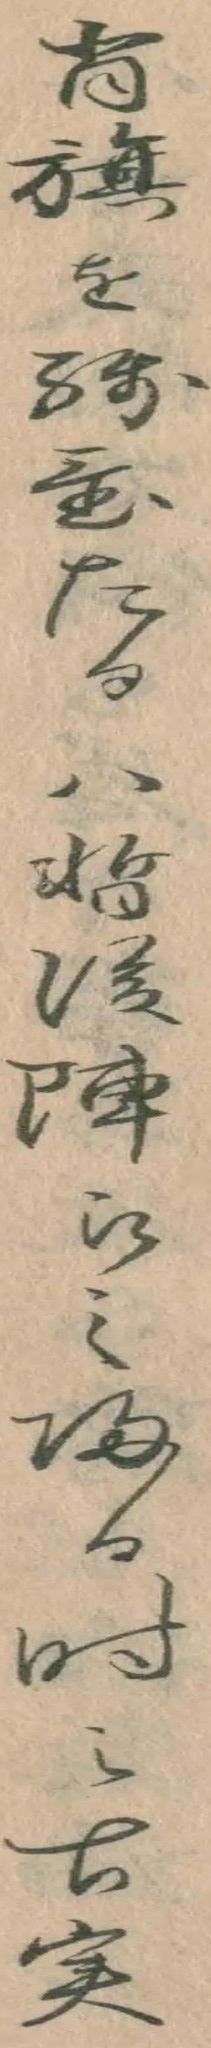背旗を残置たるは暫後陣江之帰る時之古実
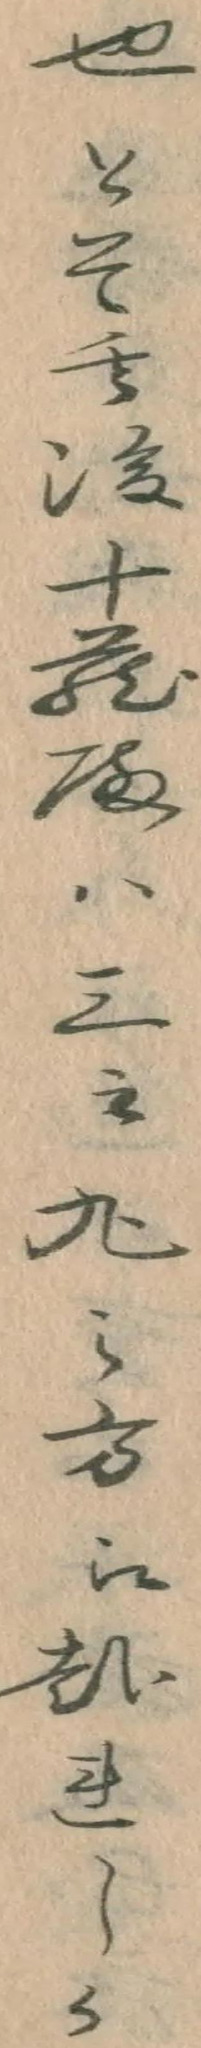也とそ其後十蔵殿は三之丸之方江赴連しか
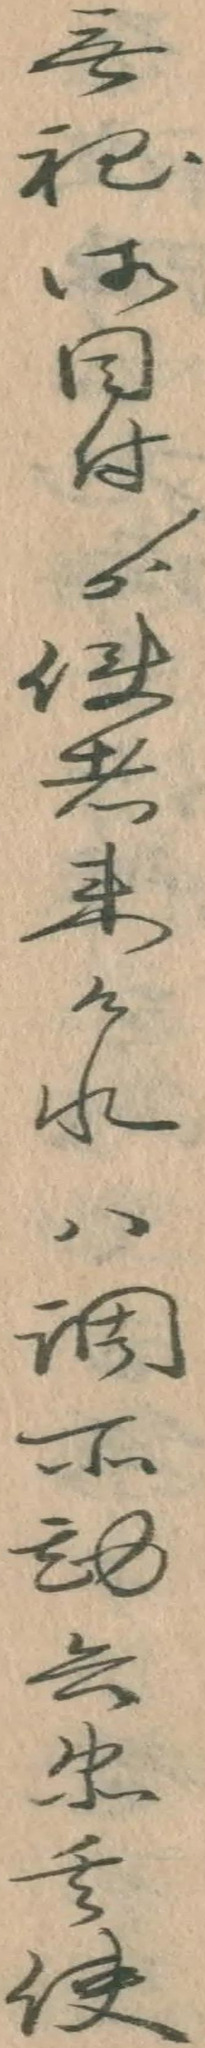無程御目付ゟ使者来けれは調所勘兵衛其使
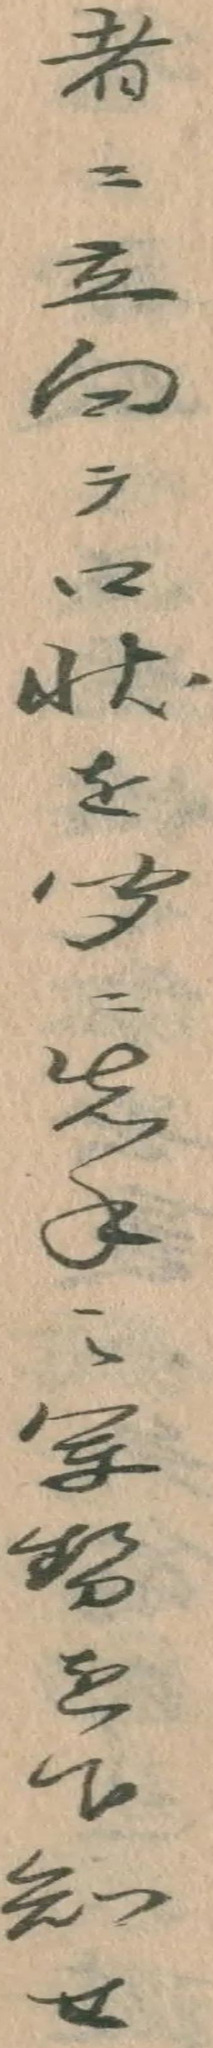者に立向て口状を聞に先手之軍勢を下知せ
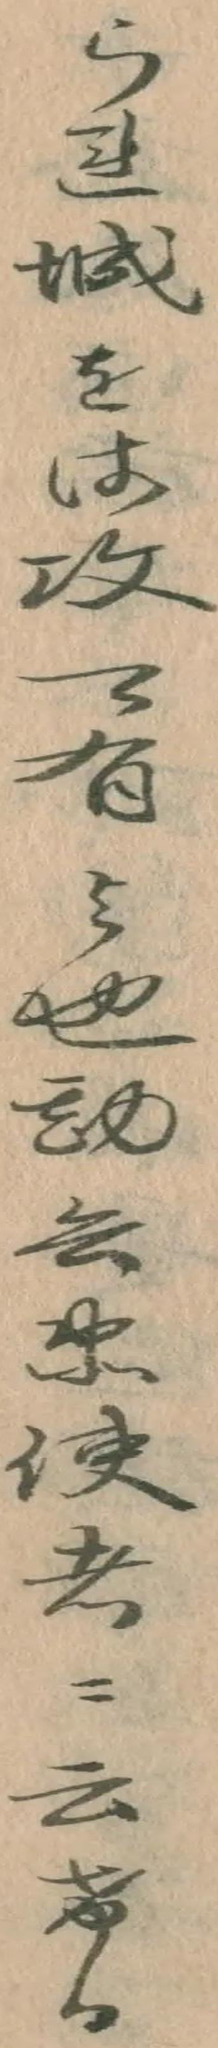ら連城を攻可有与也勘兵衛使者に云う希る
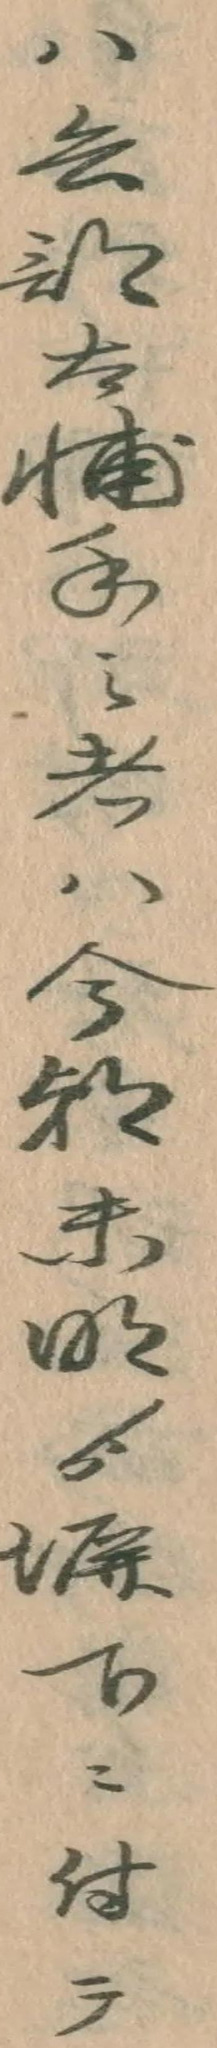は兵部太輔手之者は今朝未明ゟ塀下に付て
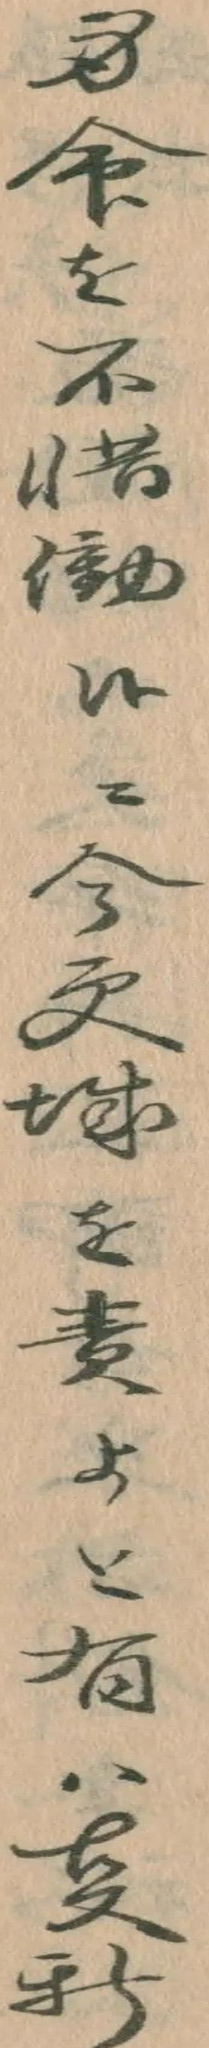身命を不惜働候に今更城を責よと有は事新
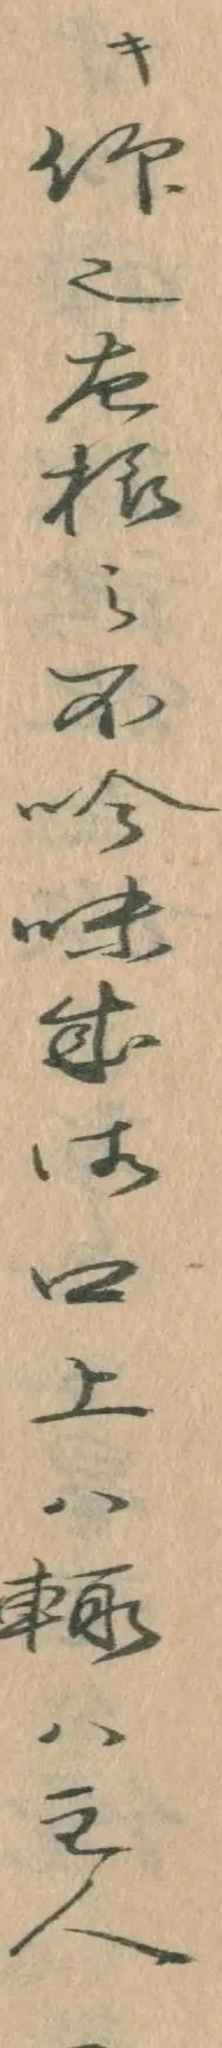き仰也左様之不吟味成御口上は輙は主人に
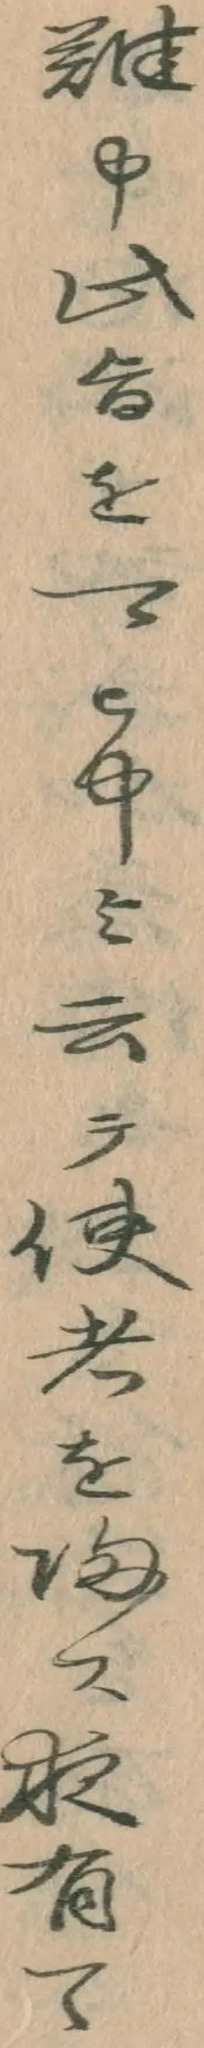難申此旨を可被申与云て使者を帰す夜有て
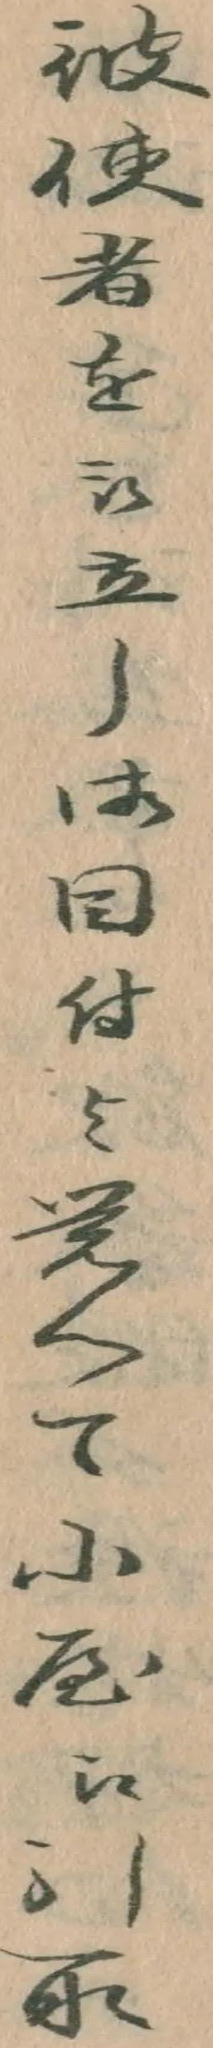彼使者を被立し御目付与覚へて小屋被引取
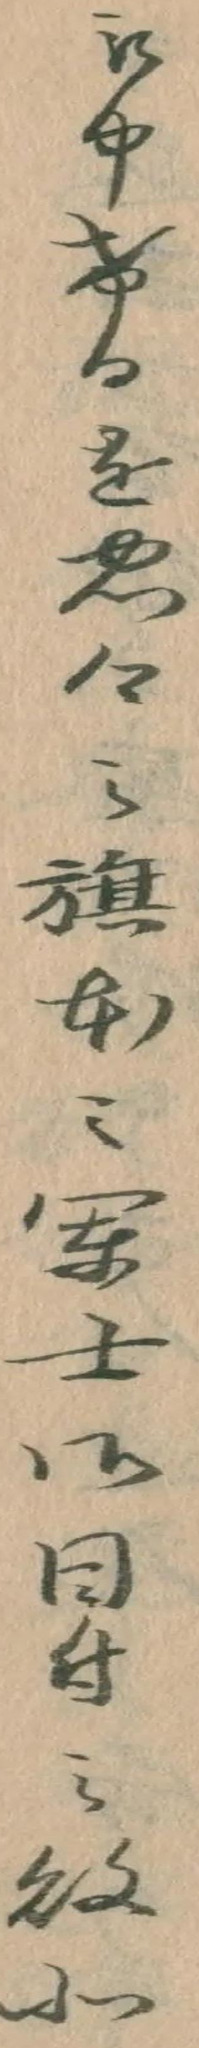被申希るを忠郷之旗本之軍士御目付之敗北
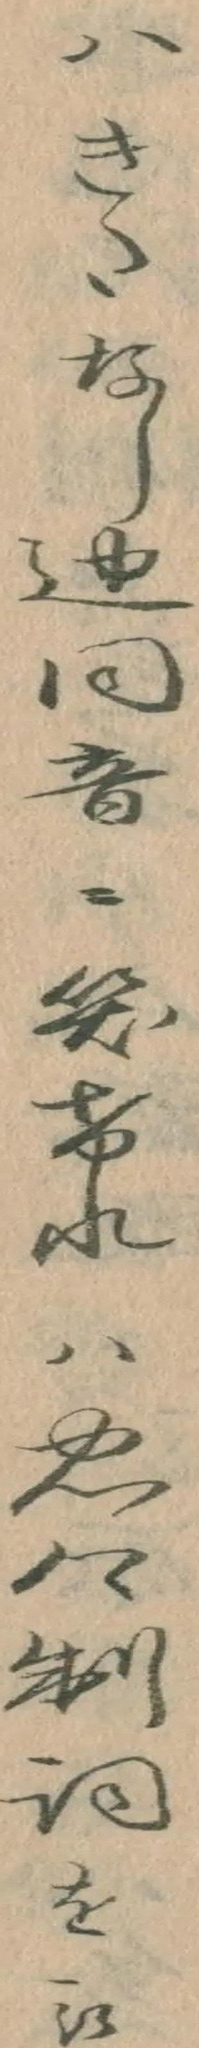はきたなし迚同音に笑希れは忠郷制調を被
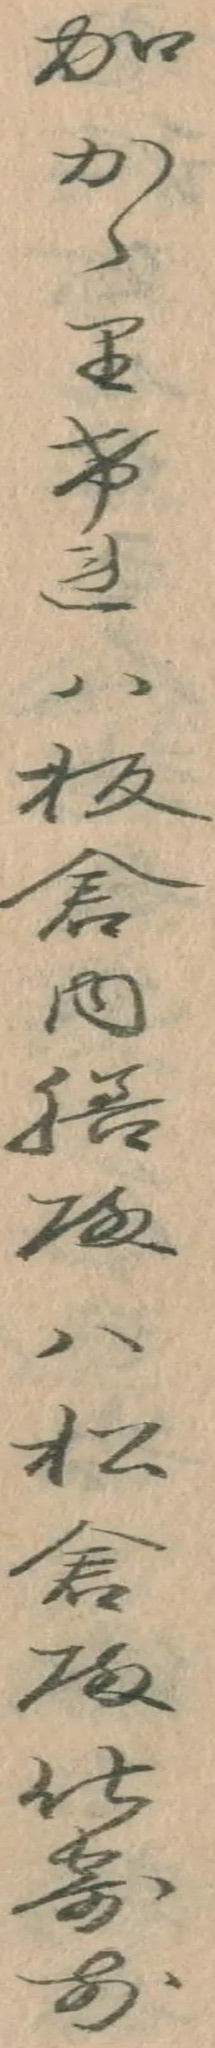加かゝ里希連は板倉内膳殿は松倉殿仕寄前
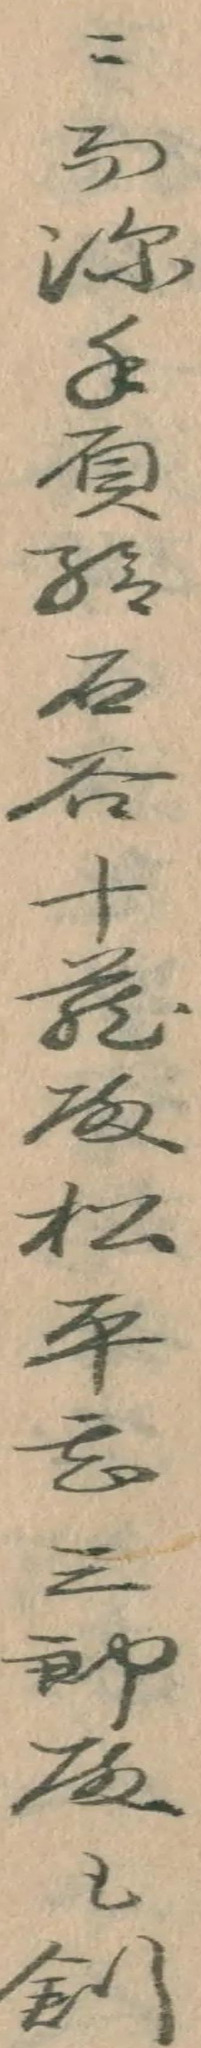に而深手負給石谷十蔵殿松平甚三郎殿も創
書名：切支丹御退治記 49巻. [5]
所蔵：国立国会図書館 National Diet Library, JAPAN
